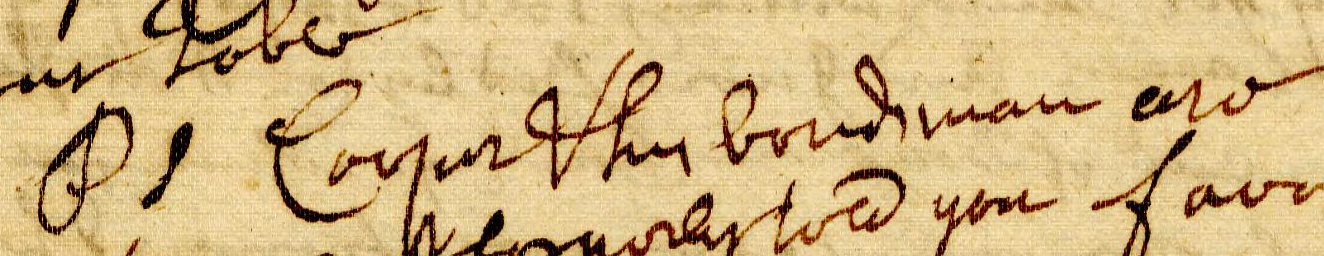PS Cooper & his bondsmen are
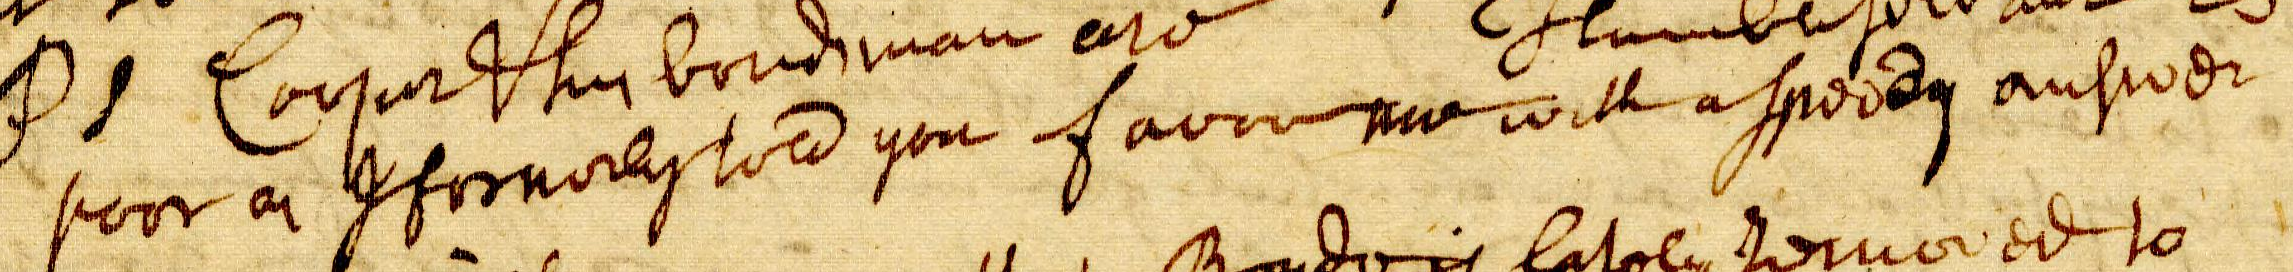poor as I formerly told you favour me with a speedy answer
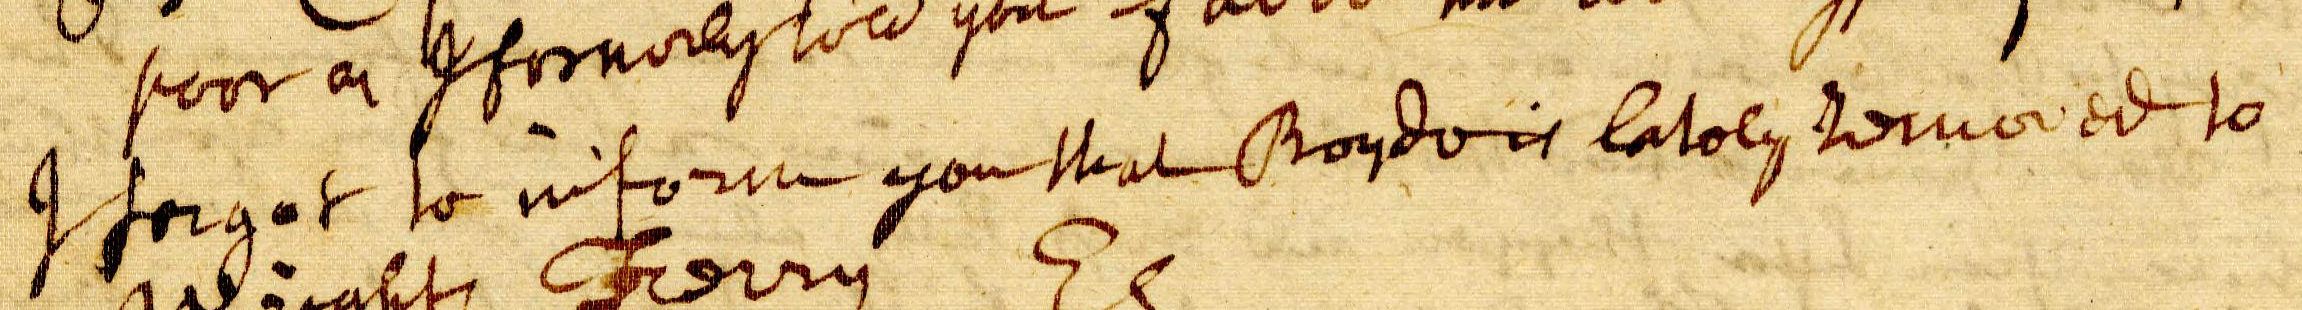I forgot to inform you that Boyds is lately removed to
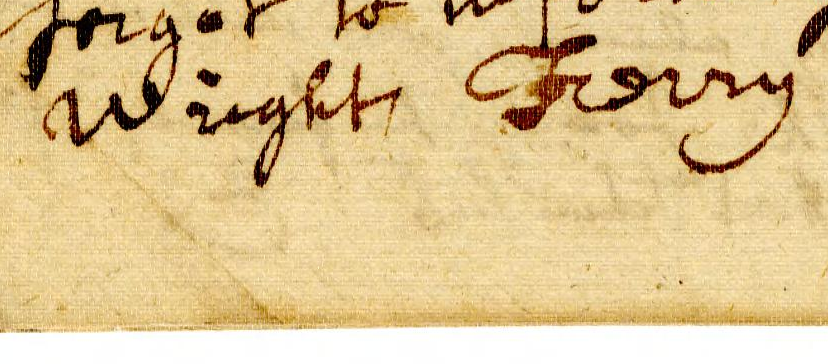Wrights Ferry
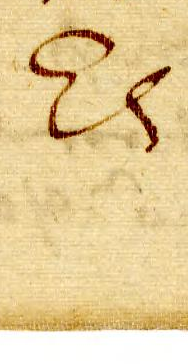ES
